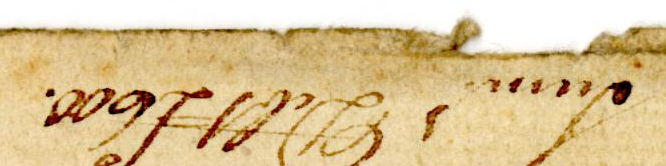Sent Debt £600
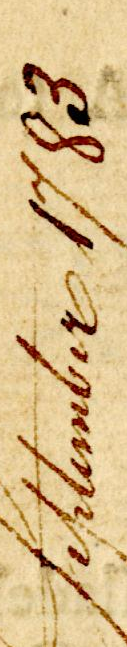September 1783
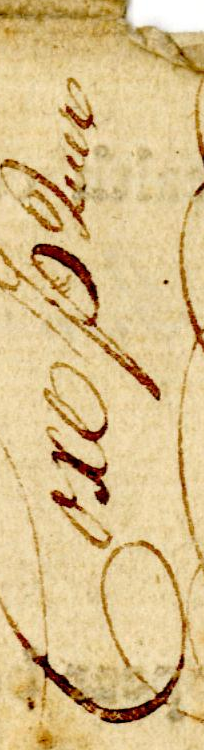Coxe Please
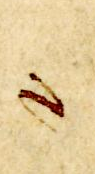V
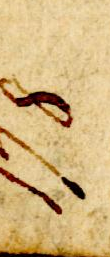178
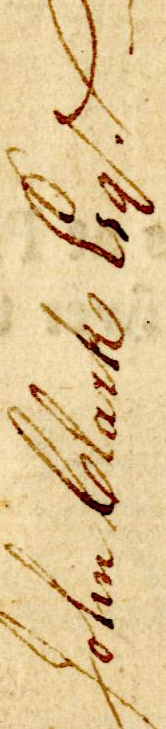John Clark Esq^r
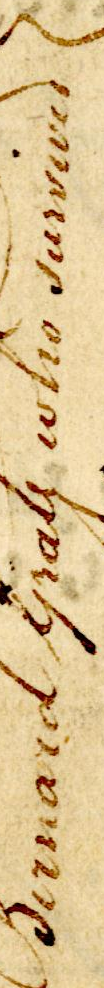Barnard Gratz who survived
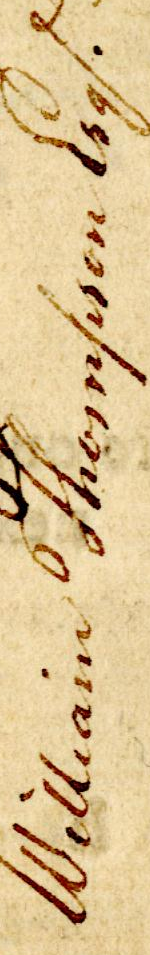William Thompson Esq^r
